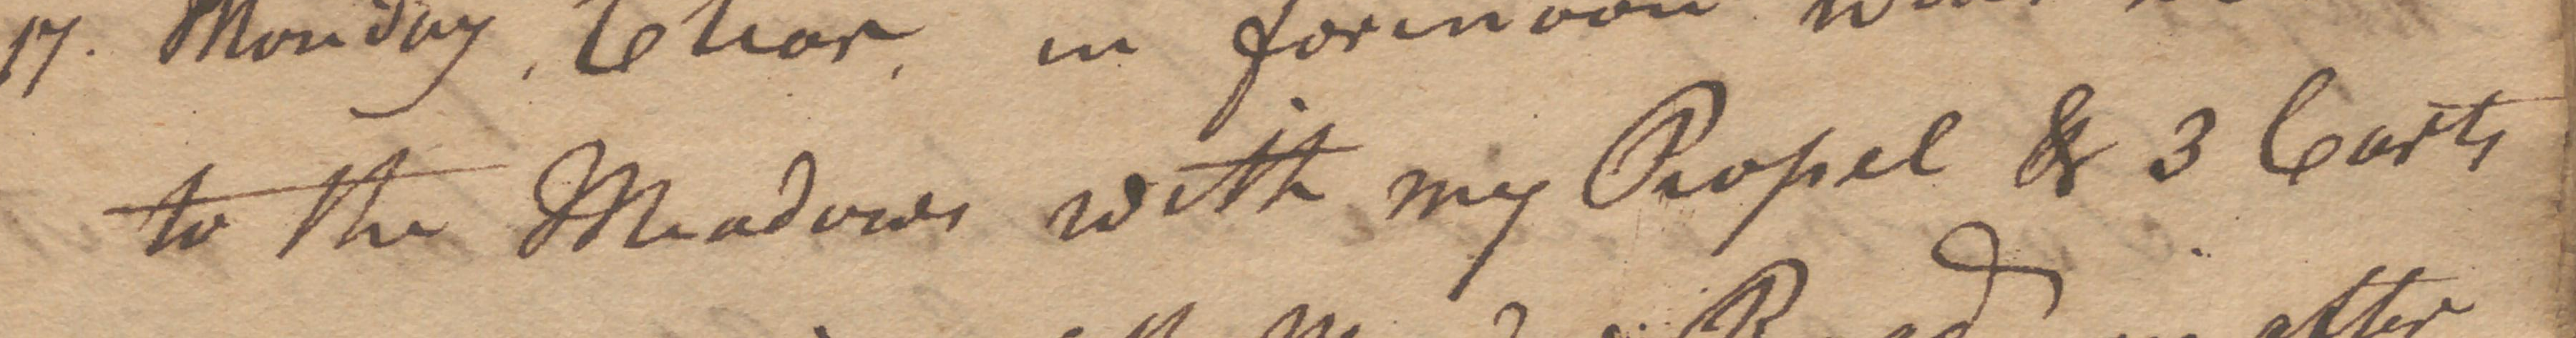to the Meadews with my Propel & 3 Carts
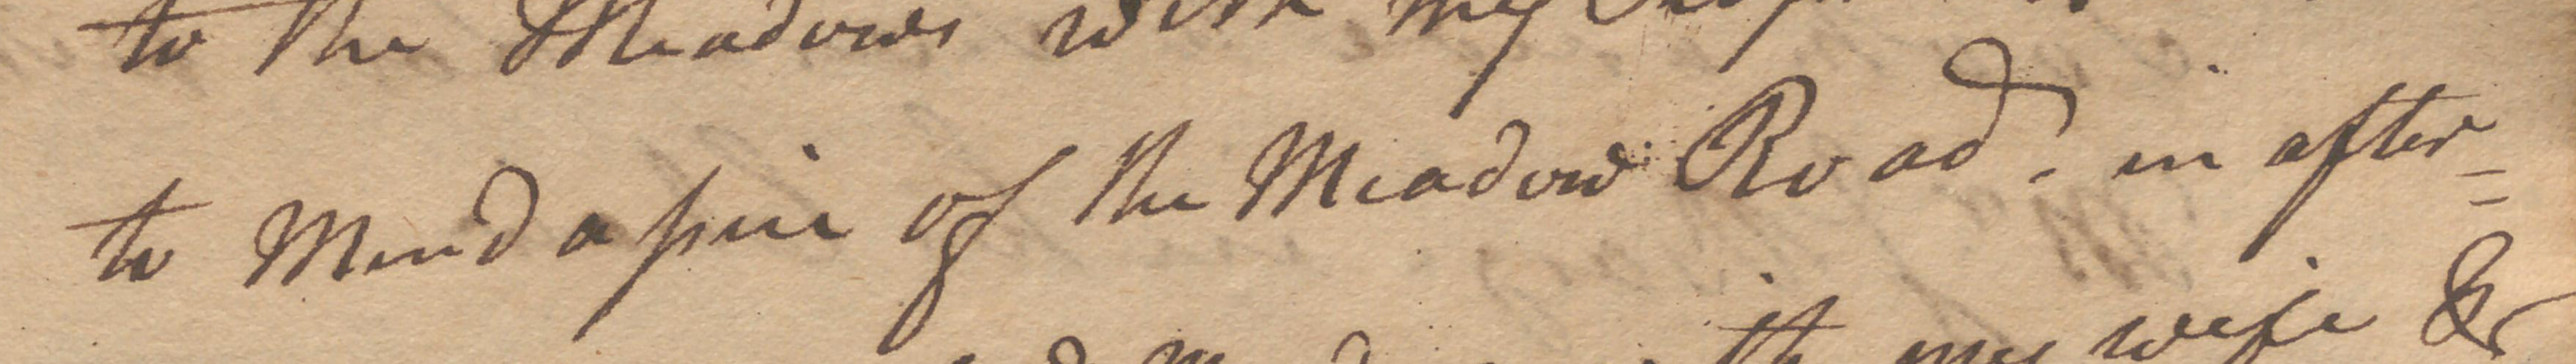to Mend a pice of the Meadow Road. in after
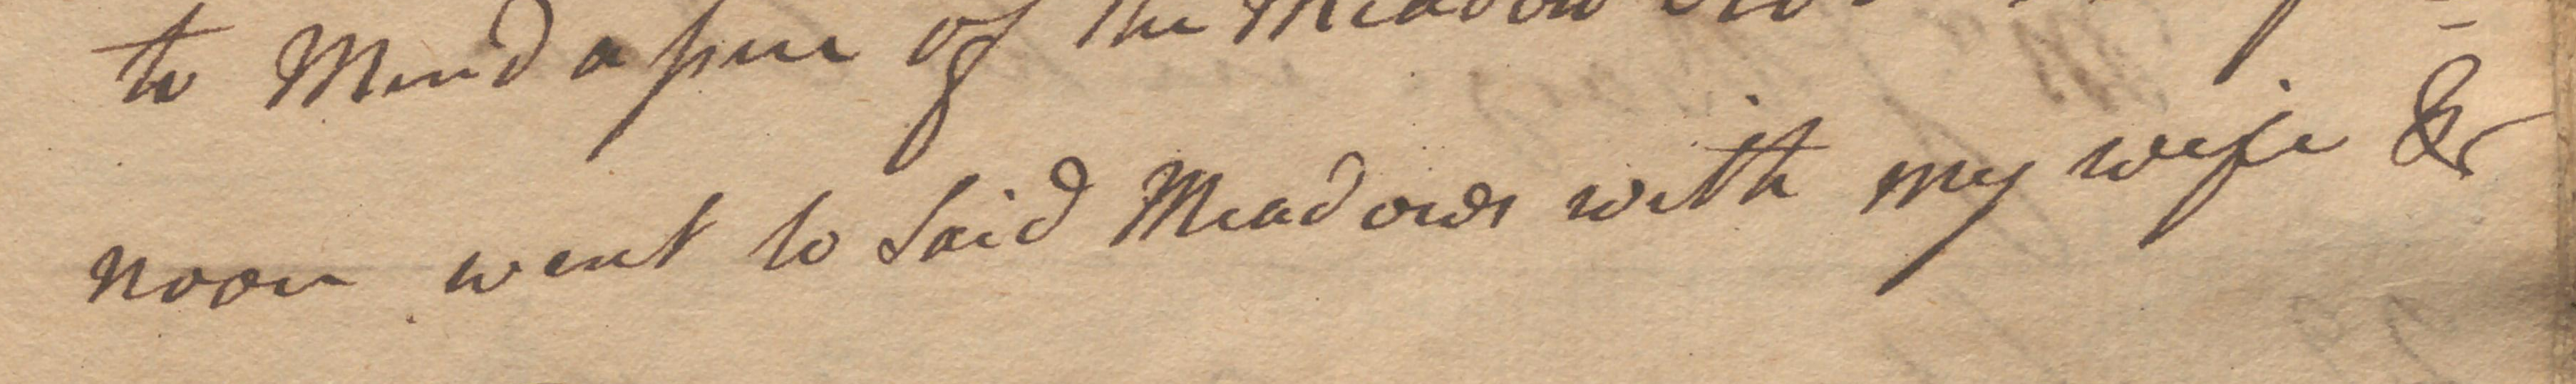noon went to said Meadows with my wife &
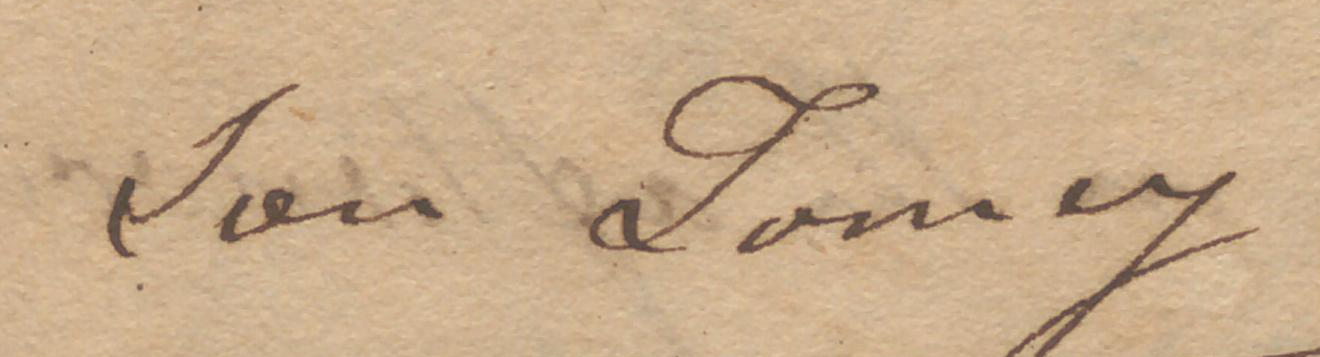Son Tomey
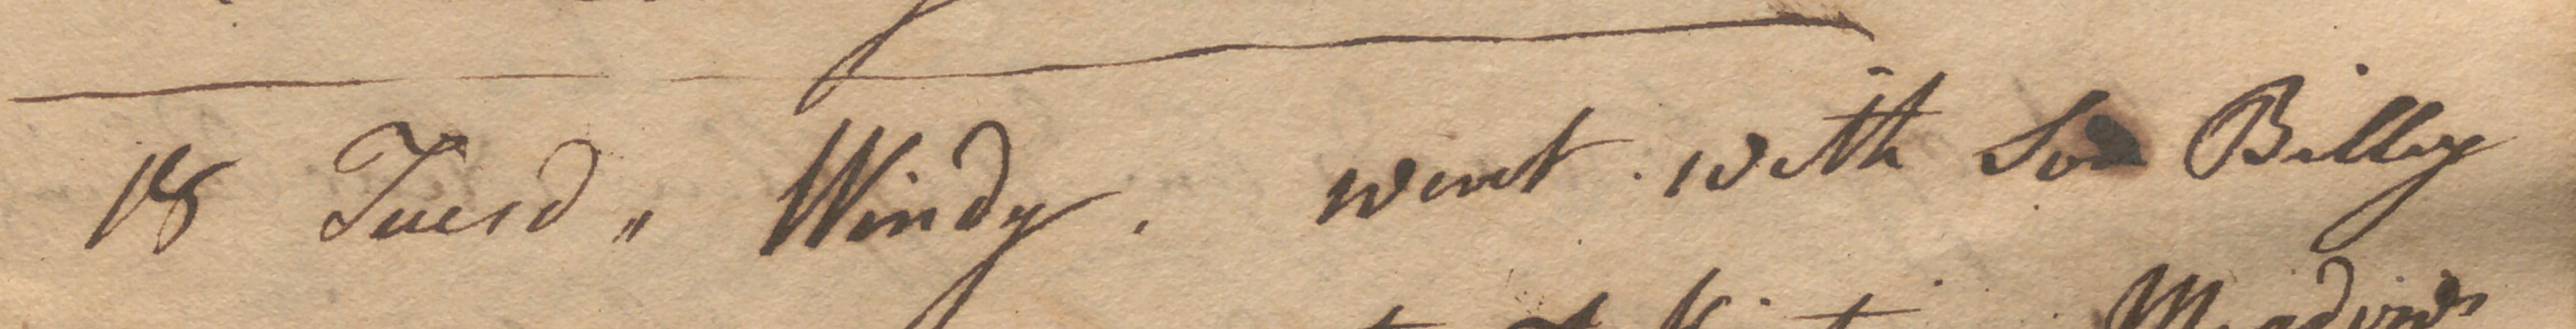15 Tuesd. Windy. went with Son Billey
